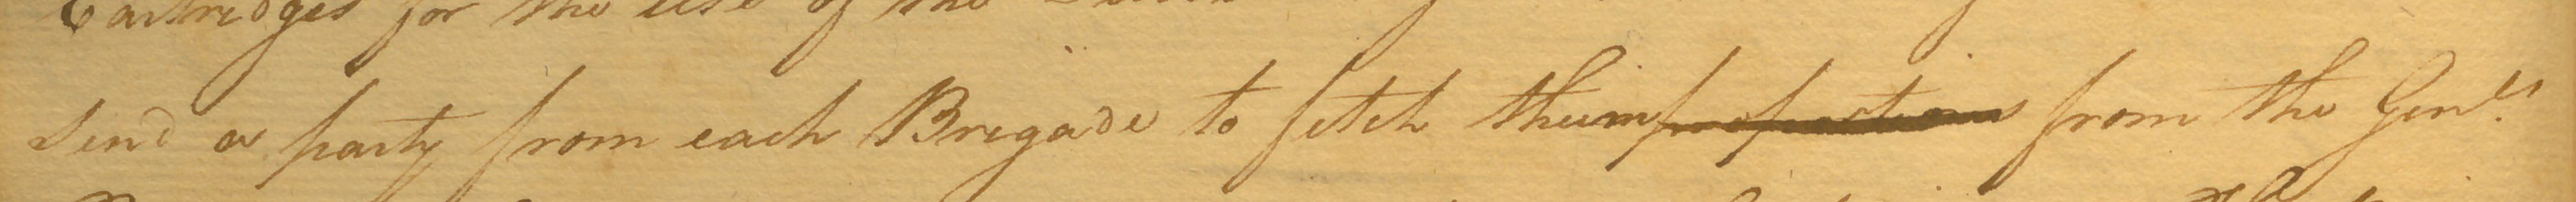send a party from each Brigade to fetch them [________]f rom the Gen^ls
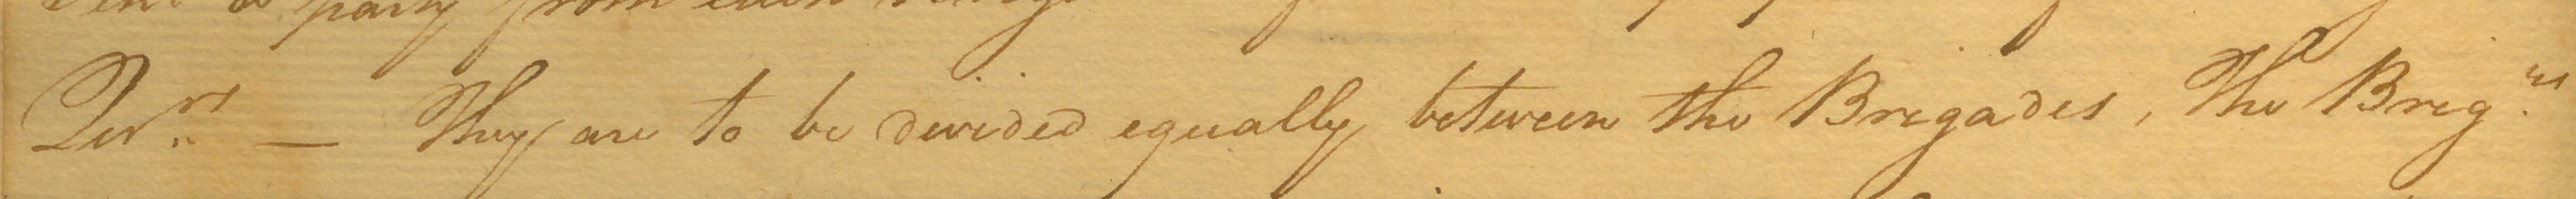Qu^rs.- They are to be divided equally between the Brigades, The Brig^rs.
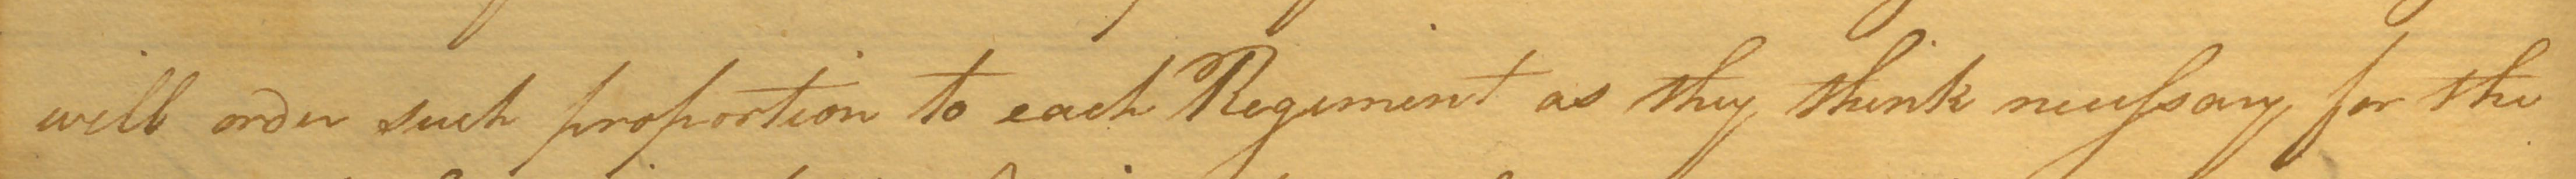will order such proportion to each Regiment as they think necessary for the
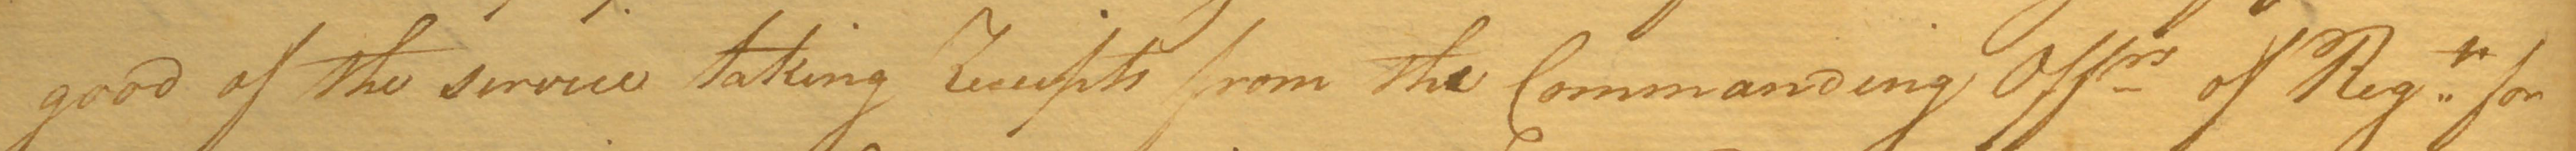good of the service taking receipts from the Commanding Off^rs of Reg^t. for
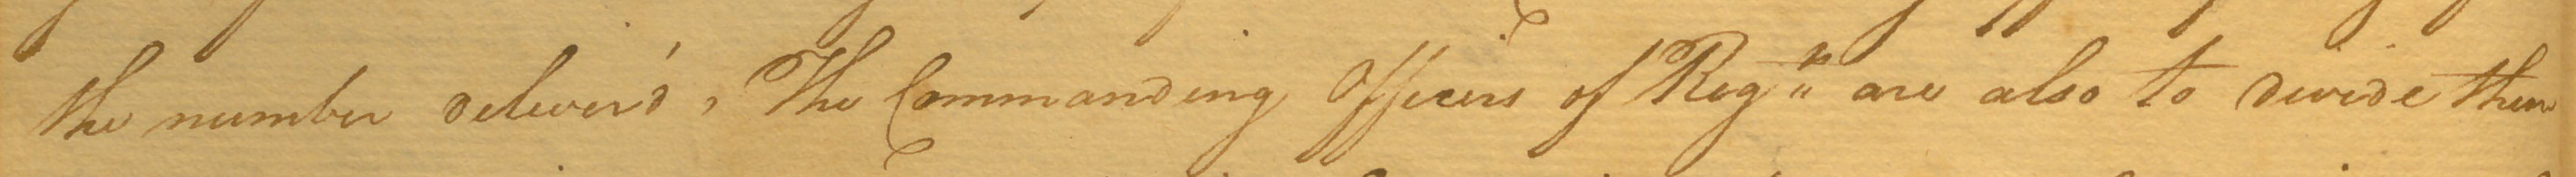the number deliver'd, The Commanding Officers of Reg^t. are also to divide them
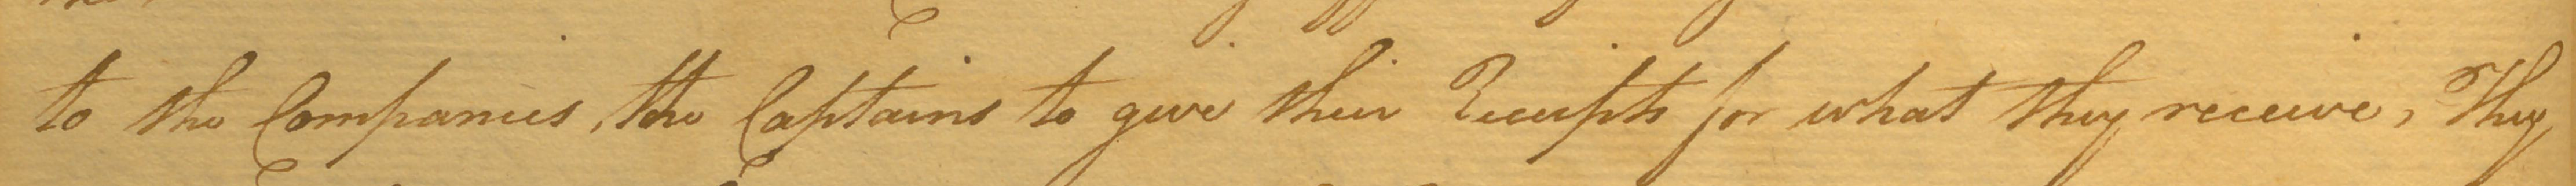to the Companies, the Captains to give their receipts for what they receive, they
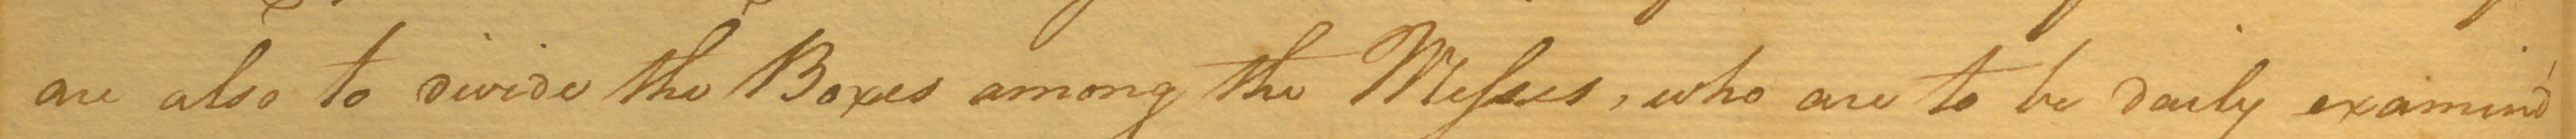are also to divide the Boxes among the Messes, who are to be duly examin'd
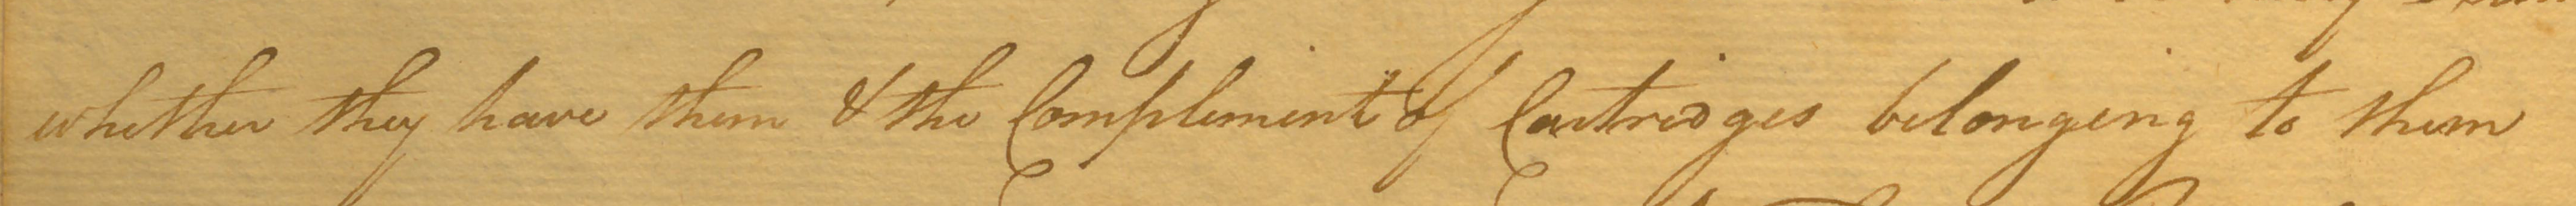whether they have them & the Complement of Cartridges belonging to them
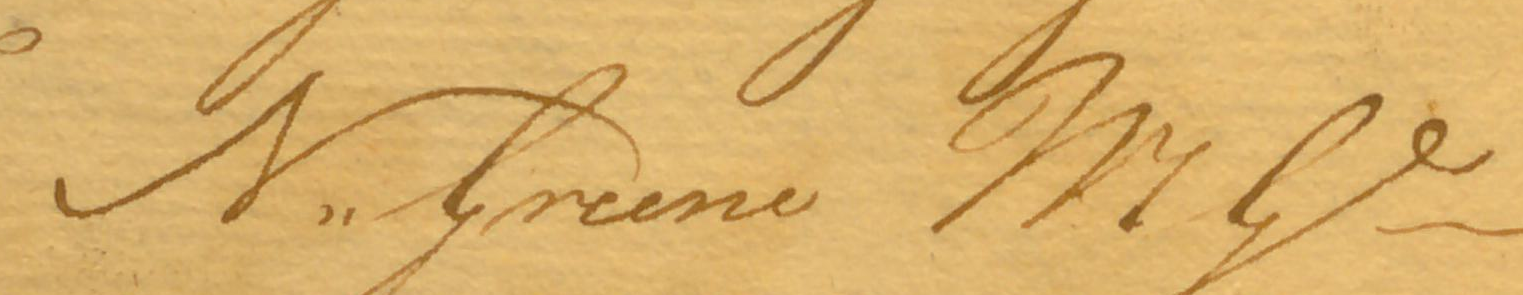N. Greene M G^l
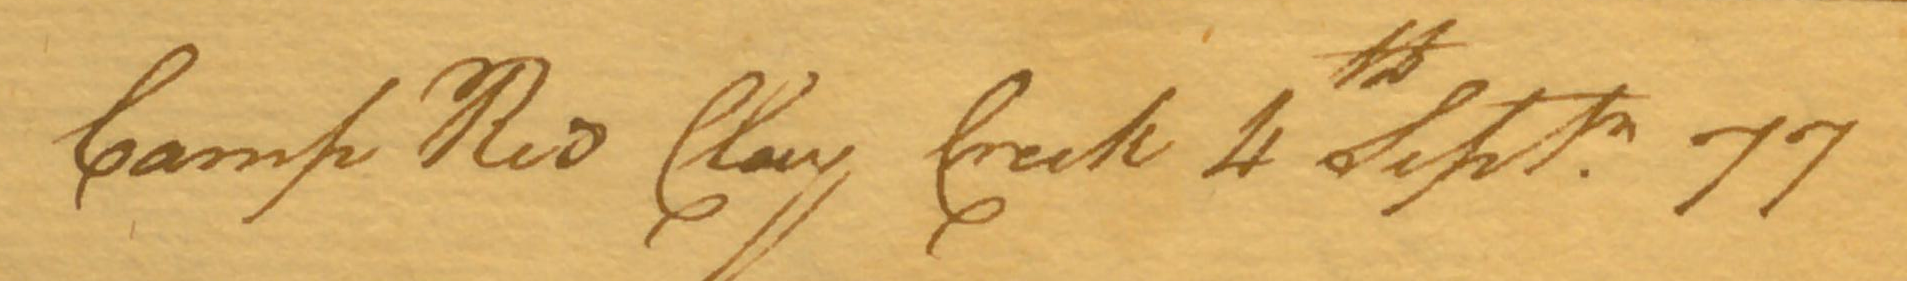Camp Red Clay Creek 4^th Sept^r. 77
